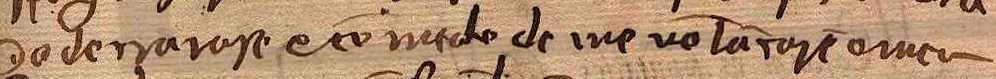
q̄ o decrarase e cō medo de me nō lāçarē o meu
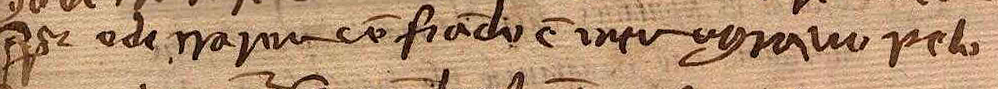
ꝓꝓdor o decrarou e cōfiādo ē meu agrauo pelo
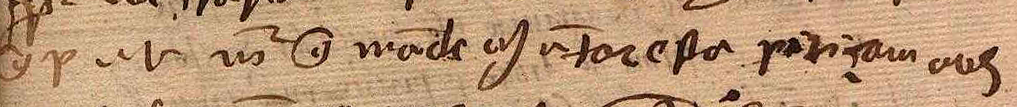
q̄ p a V mr q̄ māde aJūtar esta pitiçam aos
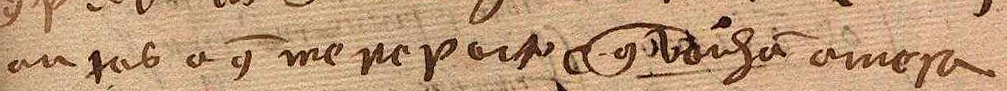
autos a q̄ me reporto e q̄ venhā a mesa
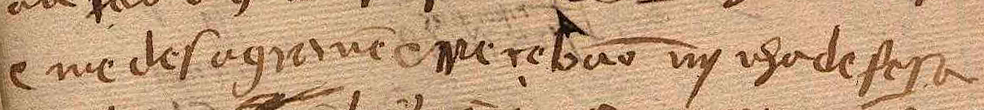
e me desagrauē e rrecebão mjnha defesa
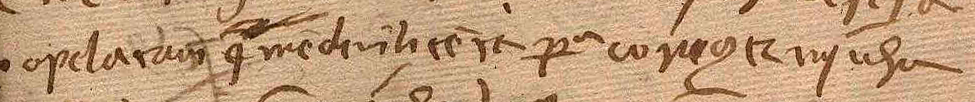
e apelaçam q̄ me dem licēça ꝑa coreger mjnha
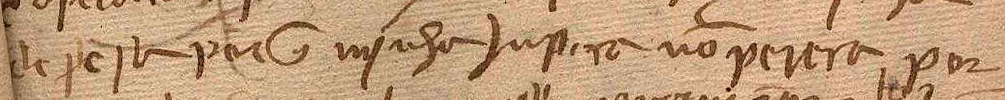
defesa por q̄ mjnha Justiça nō pereça por
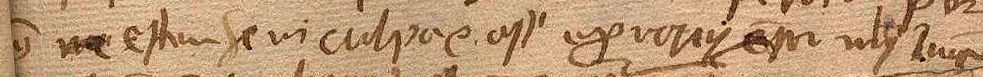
q̄ me estou sem culpa e assi o ꝓuarey e por mto boa
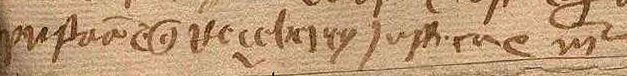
pristaā e q̄ Receberey Justiça e mr
